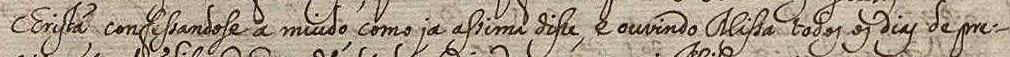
christã confessandose a miudo, como ja assima disse, e ouvindo Missa todos os dias de pre
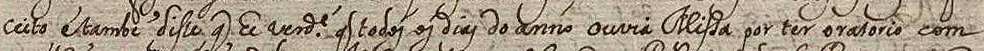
ceito, e tambē disse q̄ he verd.e q̄ todos os dias do anno ouvia Missa por ter oratorio com
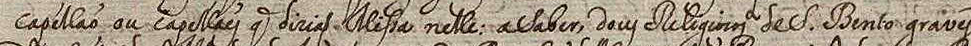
capellaõ ou capellaẽs q̄ diziaõ Missa nelle: a Saber, dous Religiozos de S. Bento graves
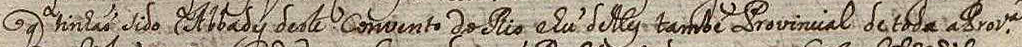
q̄ tinhaõ sido Abbades deste Convento do Rio, e hū delles tambē Provincial de toda a Prov.a
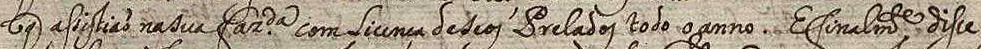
q̄ assistiaõ na sua faz.da com Licença de seos Prelados todo o anno. E finalmte disse
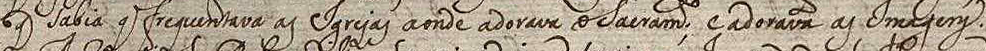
q̄ sabia q̄ frequentava as Igrejas aonde adorava o Sacramto. e adorava as Imagens.
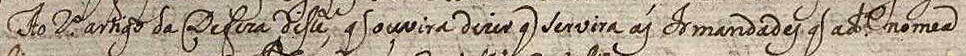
Ao 2.o artigo da Defeza disse, q̄ ouvira dizer q̄ servira ás Irmandades q̄ a d̄.a nomea
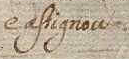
e assignou
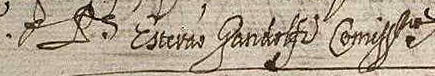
O P.e Estevaõ Gandolfi Comiss.rio
